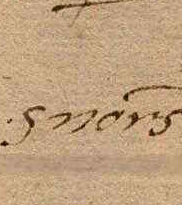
snōrs
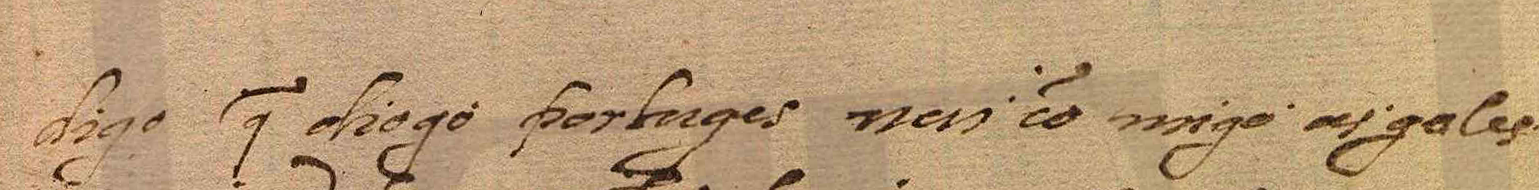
digo q̄ diogo portuges uai cōmigo as gales
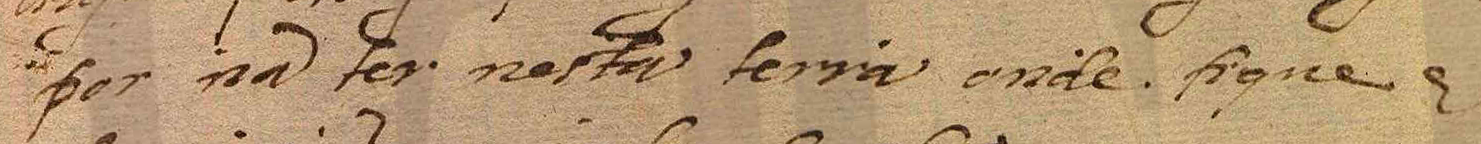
por nā ter nesta terra onde fique E
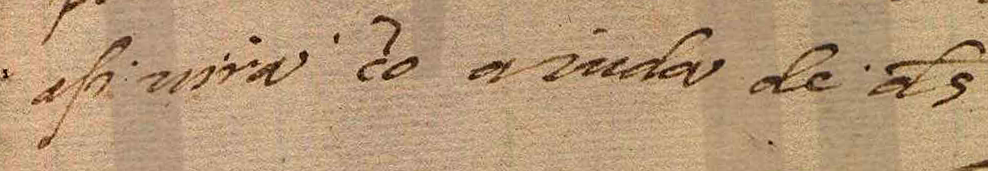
asi uira c̄o aiuda de d̄s
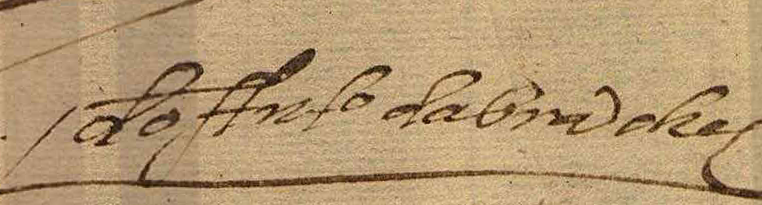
dō Anto dabrāches
